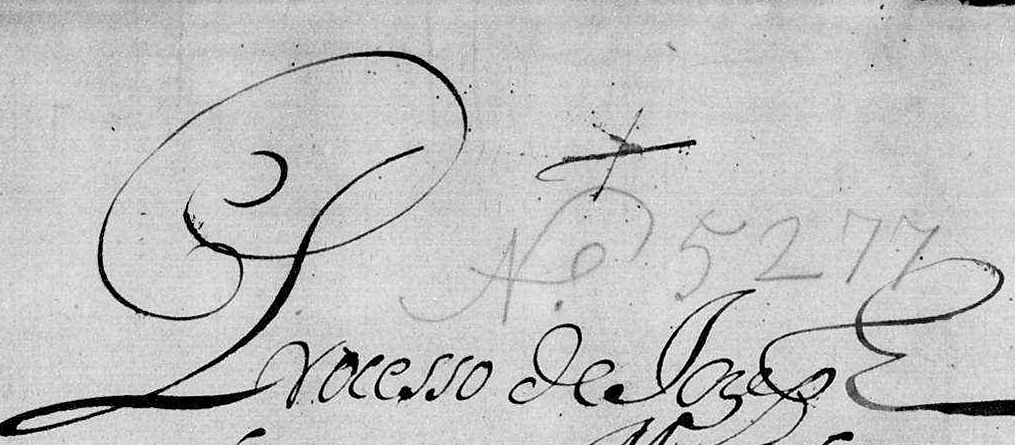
Processo de Jozeph
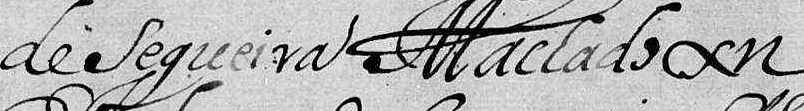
de sequeira Machado xn
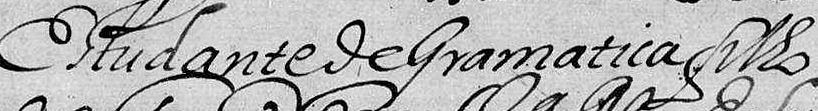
Estudante de Gramatica filho
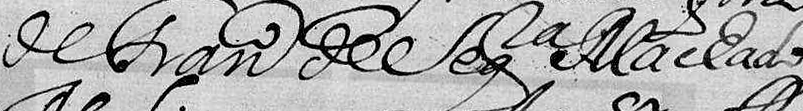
de Franco de Seqra Machado
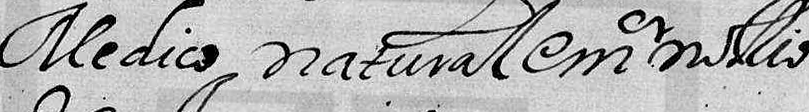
Medico natural e mor no Rio
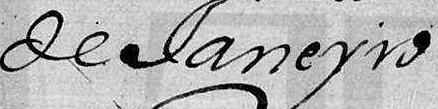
de Ianeyro
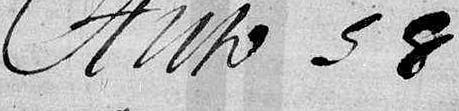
Auto 58
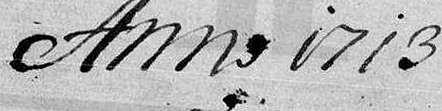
Anno i7i3
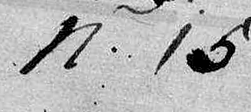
n.o i5.
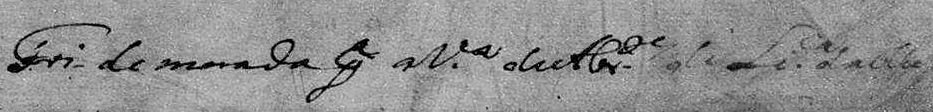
Foi de morada pa a V.a de Abr.tes de Li.ca da
